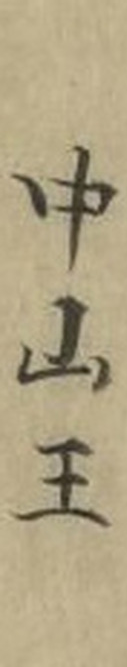中山王

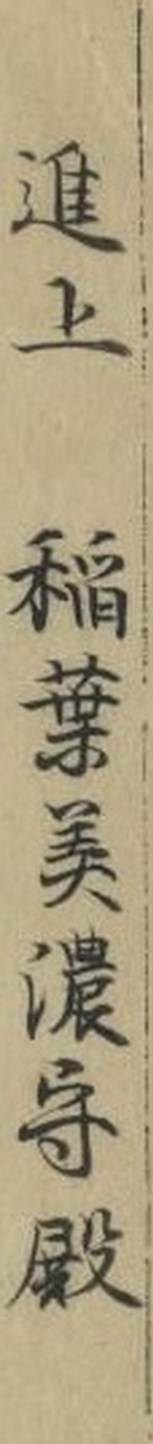進上稲葉美濃守殿
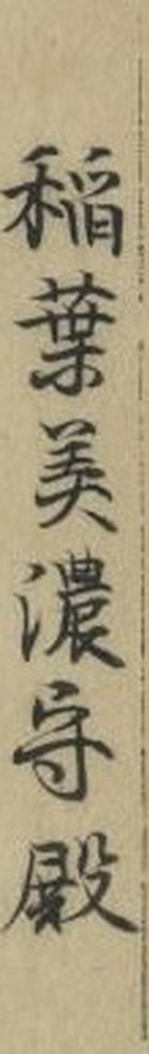進上稲葉美濃守殿
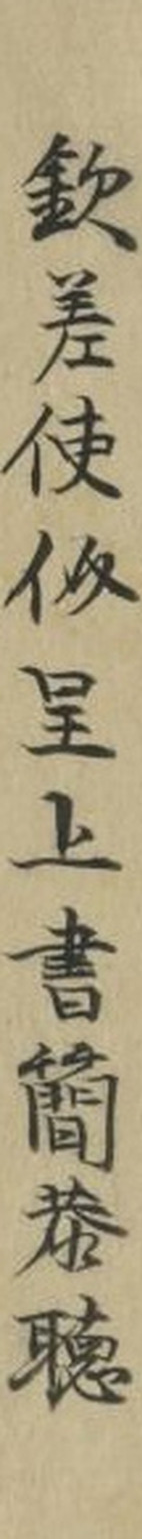欽差使价呈上書簡恭聴
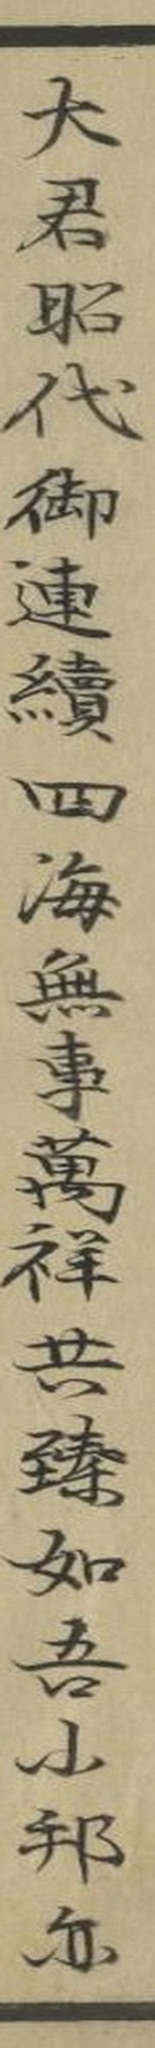大君昭代御連続四海無事万祥共臻如吾小邦亦
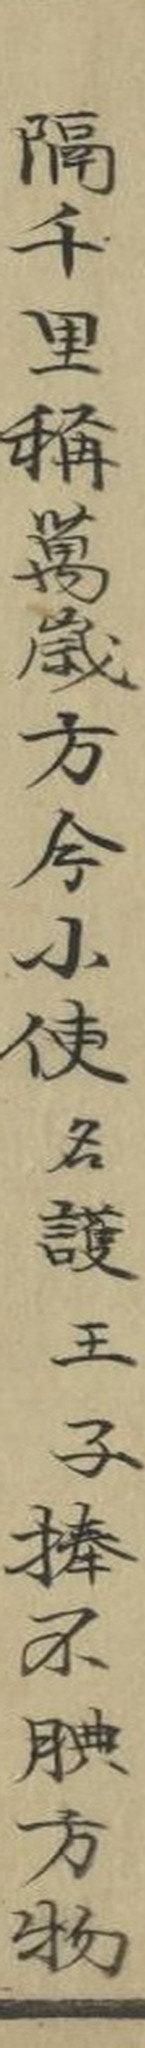隔千里称万歳方今小使名護王子捧不腆方物
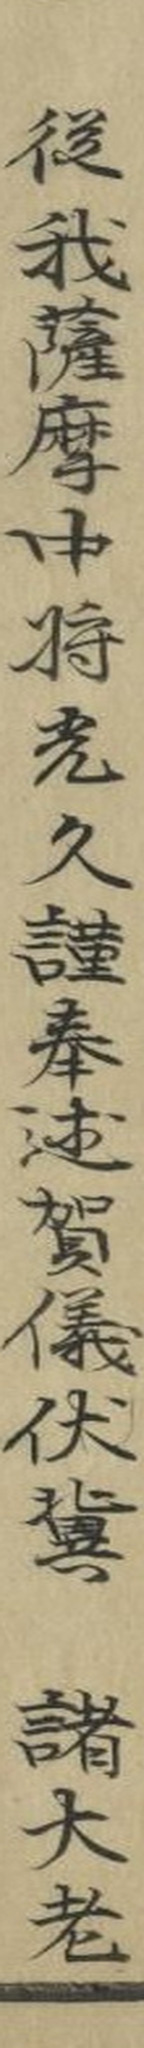従我薩摩中将光久謹奉述賀儀伏冀諸大老
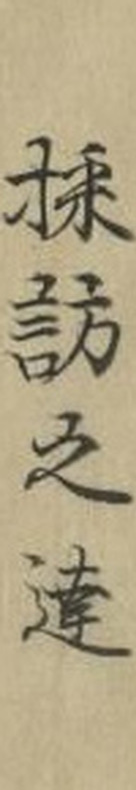採訪之達
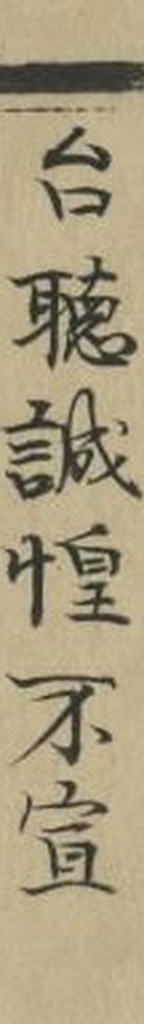台聴誠惶不宣
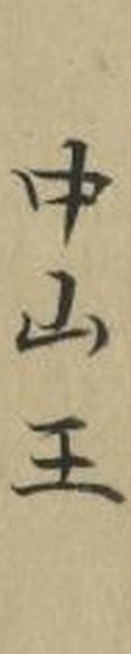中山王
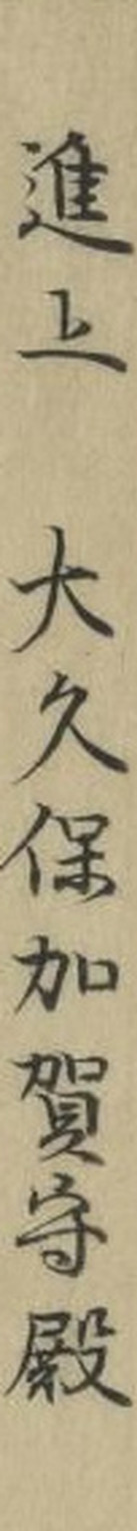進上大久保加賀守殿
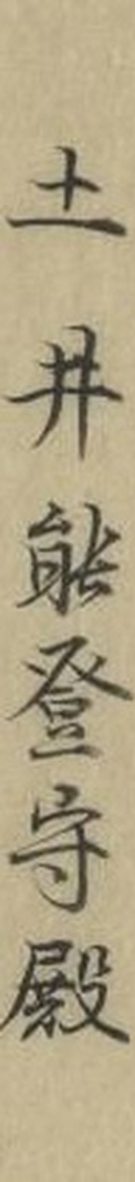土井能登守殿
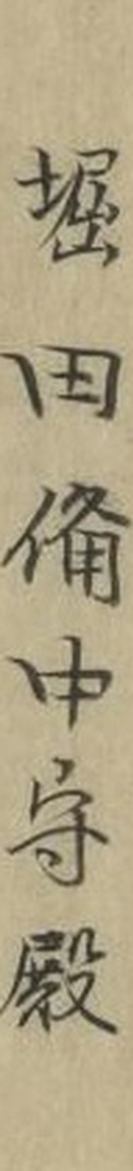堀田備中守殿
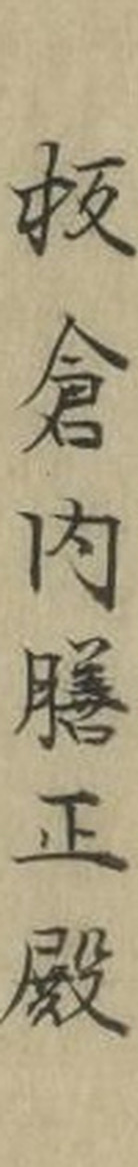板倉内膳正殿
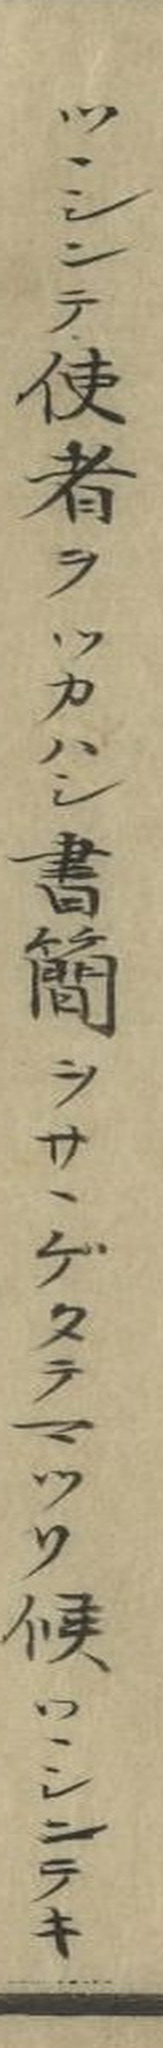ツ丶シンテ使者ヲツカハシ書簡ヲゲタテマツリ候ハ丶シニテキ
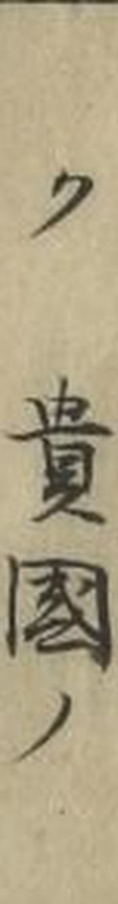ク貴国ノ
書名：琉球往来（下）
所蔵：University of the Ryukyus Library
